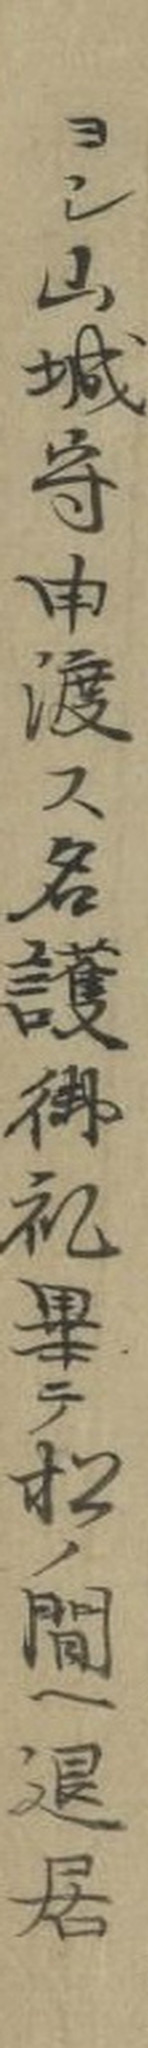ヨシ山城守申渡ス名護御礼畢テ松ノ間へ退居

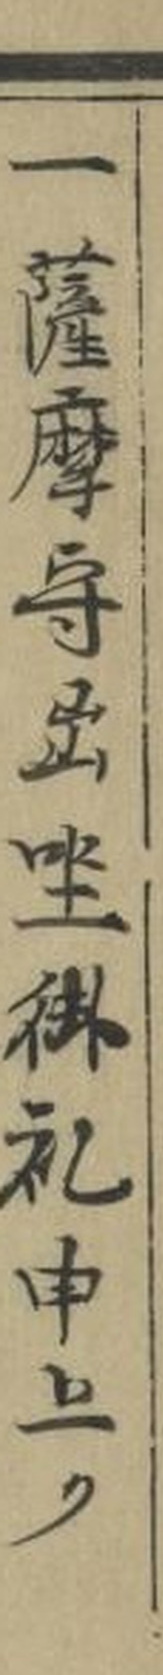一薩摩守出座御礼申上ク
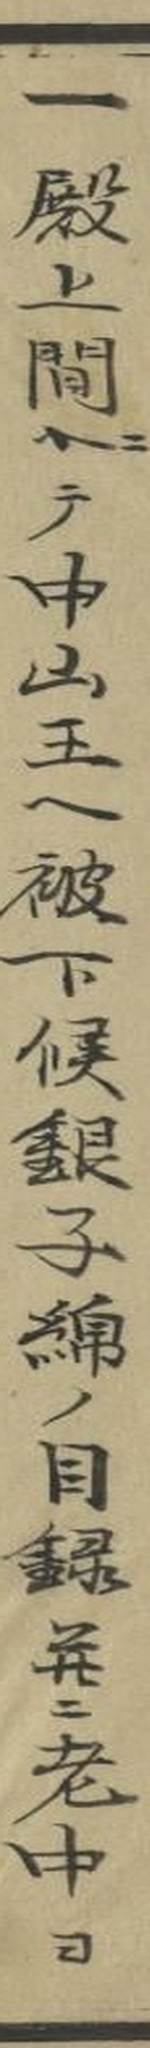一殿上間ニテ中山王へ被候銀子綿ノ目録并老中ヨ
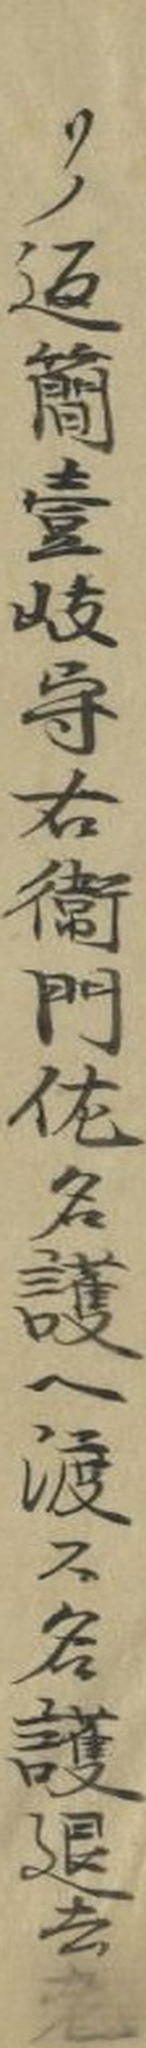リノ返簡壱岐守右衛門佑名護ヘ渡ス名護退去老
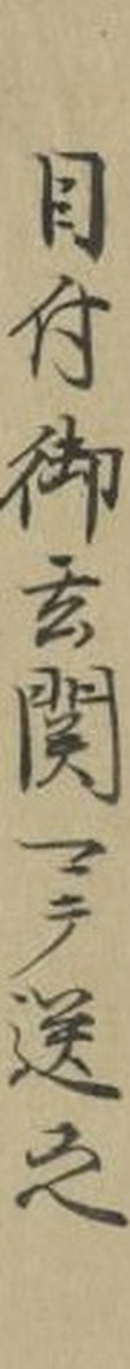目付御玄関マテ送之
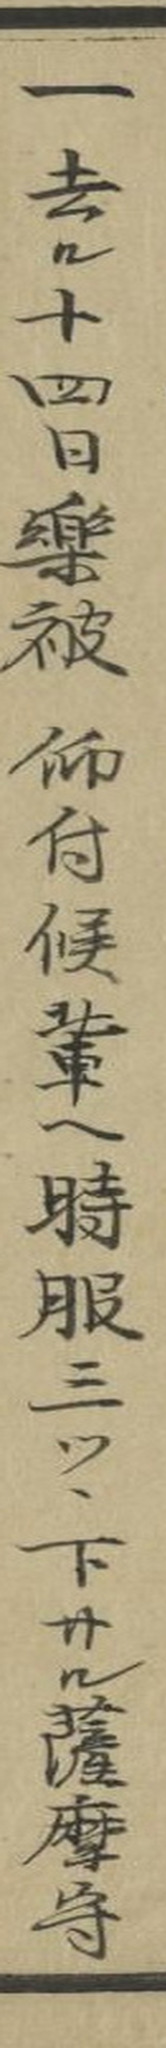一去ル十四日楽被仰付候輩ヘ時服三ツ丶下サル薩摩守
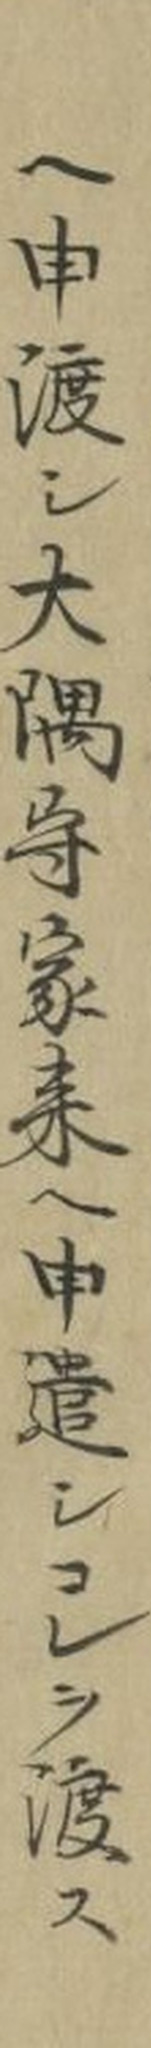ヘ申渡シ大隅守家来ヘ申遣シコレラ渡ス
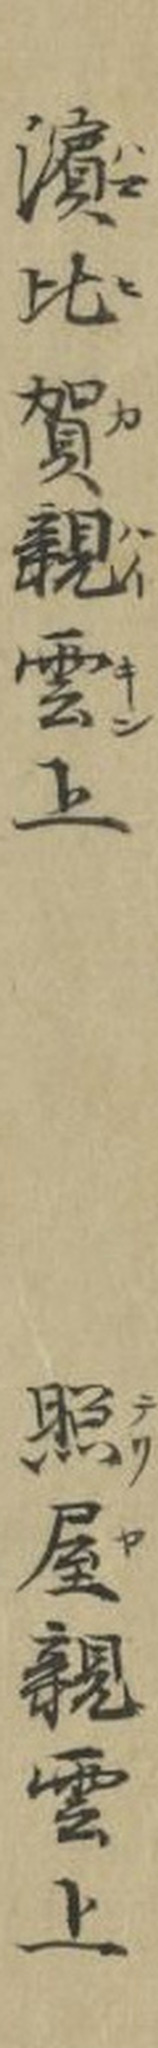濱比賀親雲上照屋親雲上
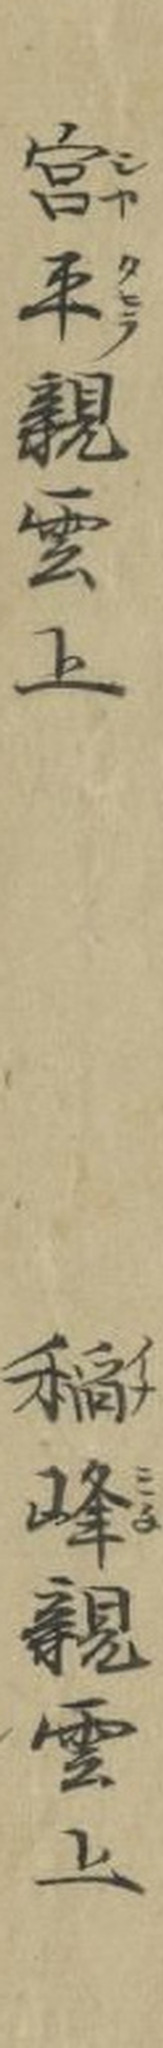宮平親雲上稲峰親雲上
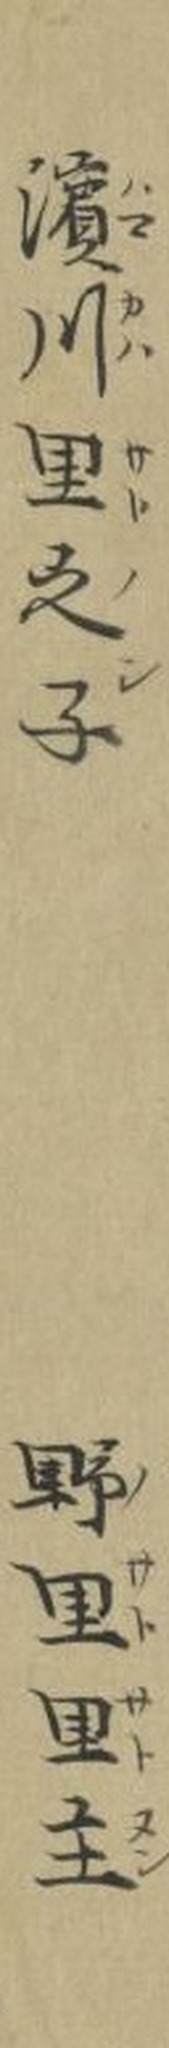濱川里之子野里里主
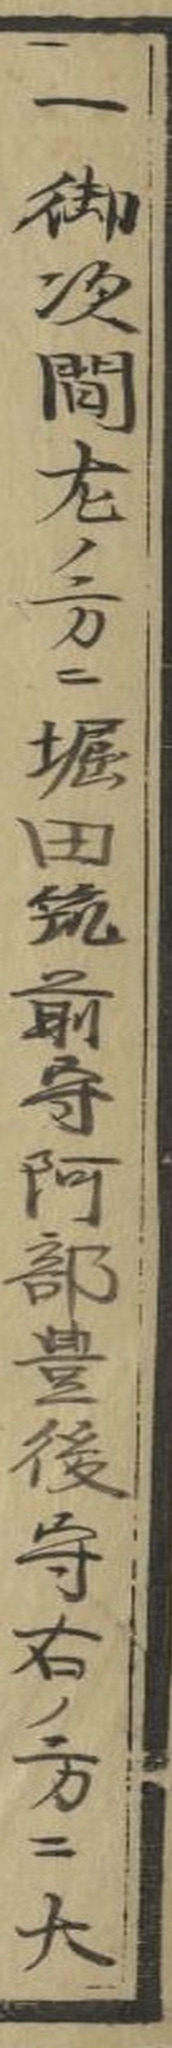一御次間左ノ方ニ堀田筑前守阿部豊後守右ノ方ニ大
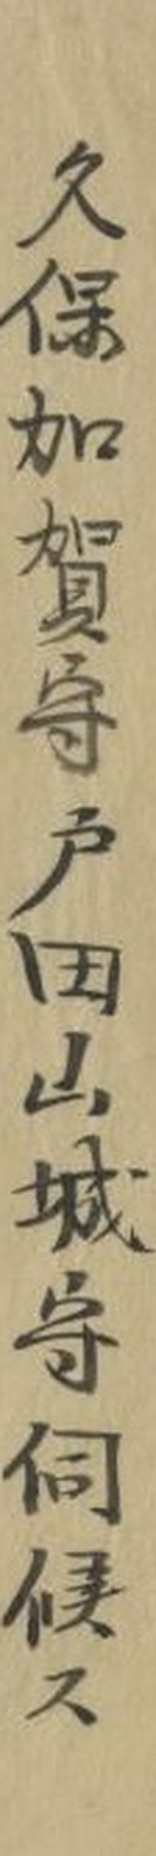久保加賀守戸田山城守伺候ス
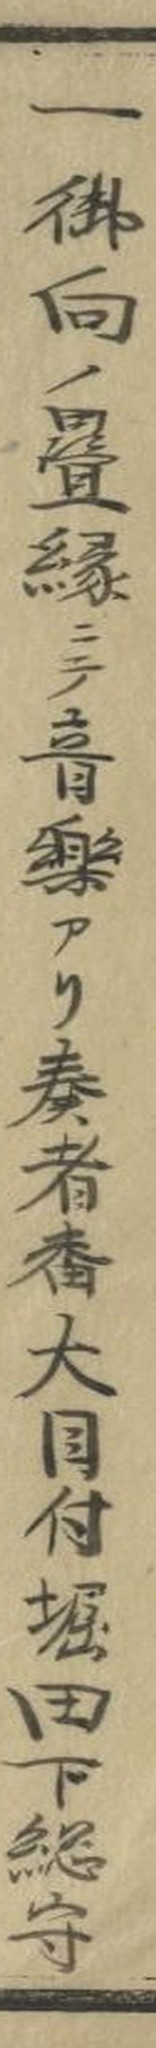一御向ノ畳縁ニテ音楽アリ奏者番大目付堀田下総守
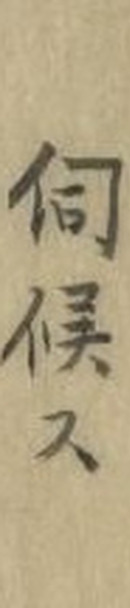伺候ス
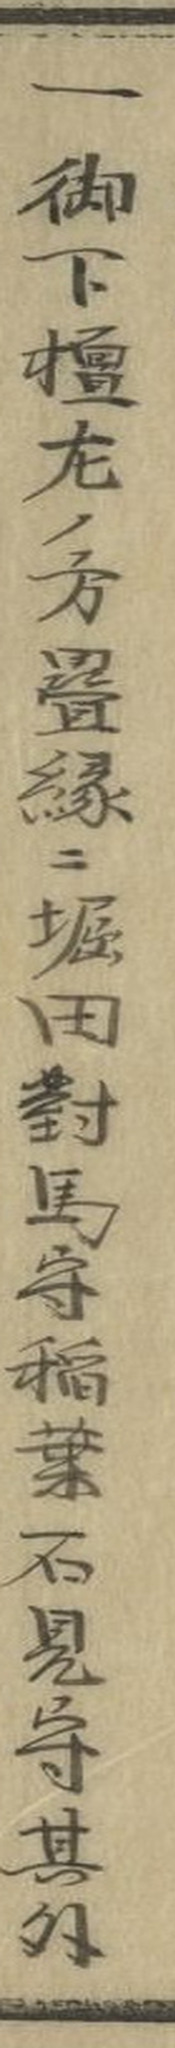一御下壇左ノ方畳縁ニ堀田対馬守稲葉石見守其外
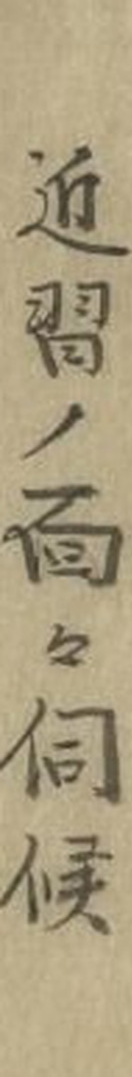近習ノ面々伺候
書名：琉球往来（下）
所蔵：University of the Ryukyus Library
